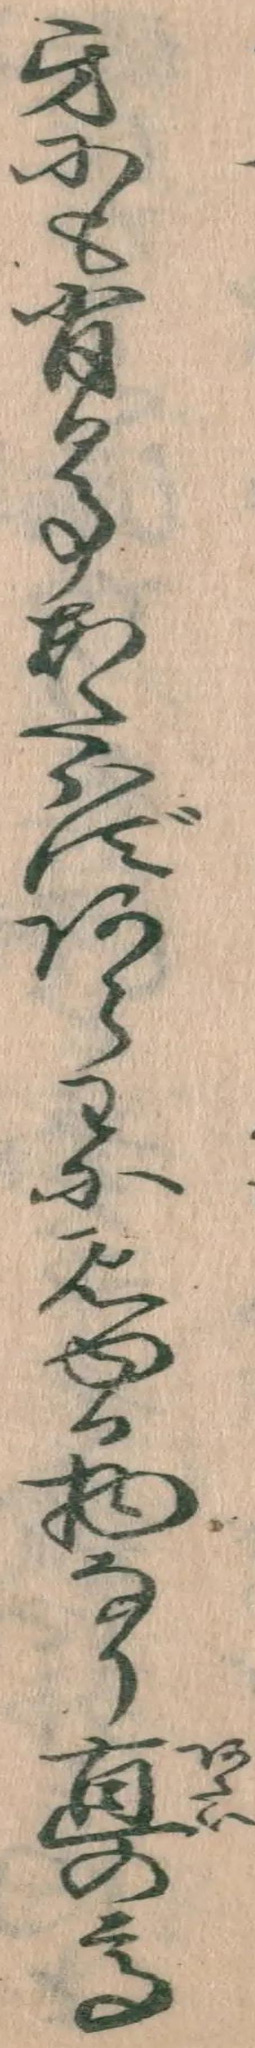牙にも肖る事あたはずあらわに見ゆる物なり直の高
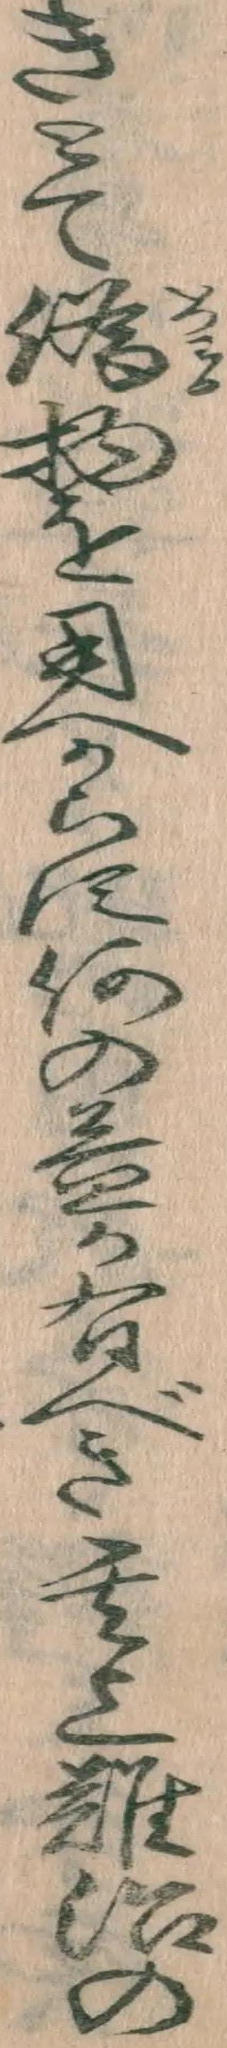きとて偽物を用へからす何の益か有べき其上難治の
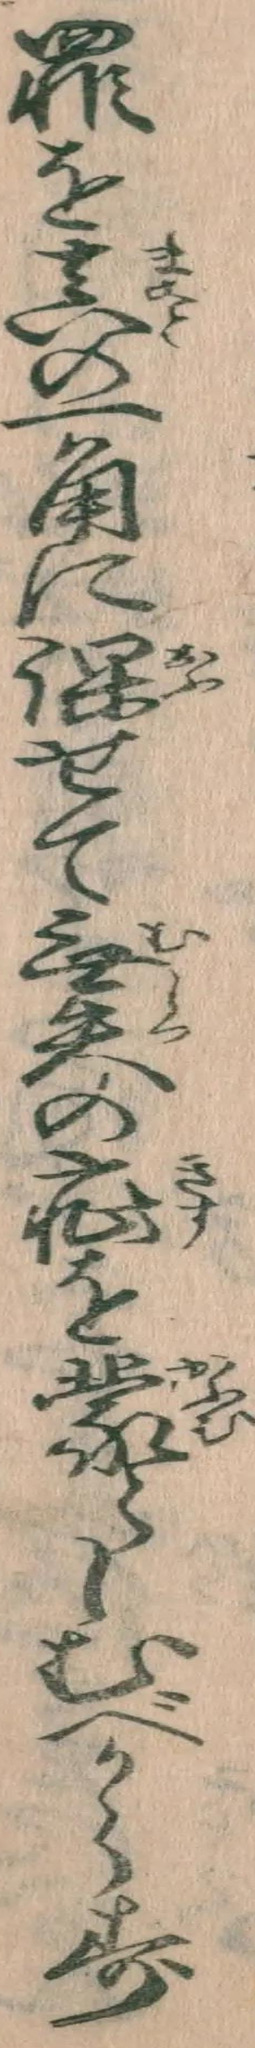罪を真の一角に保せて無失の疵を蒙らしむべからす
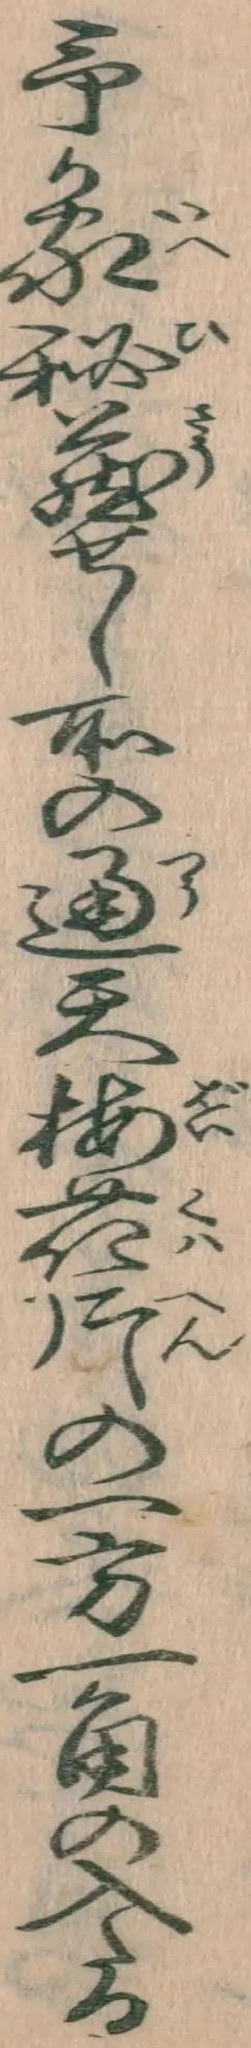予か家秘蔵せし所の通天梅花片の一方一角の入たる
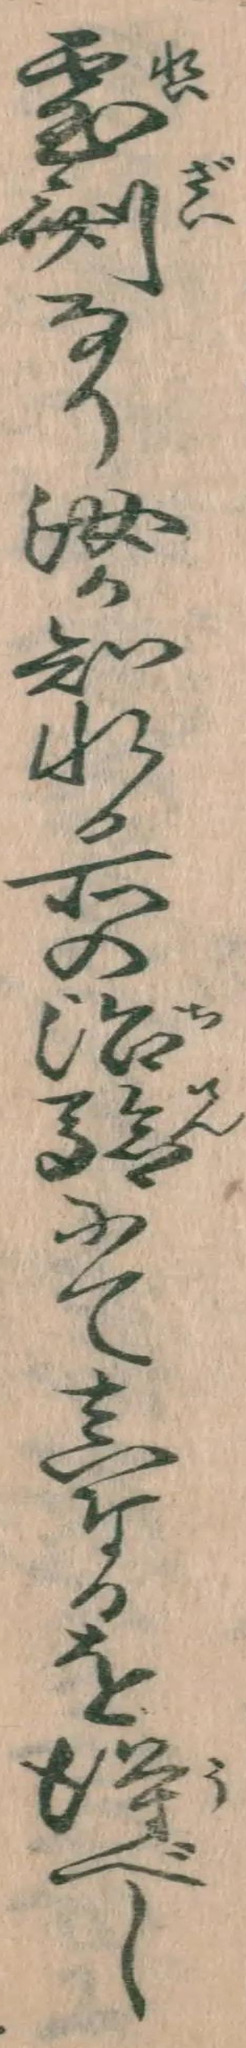霊剤なり汝か知れる所の治験にて真なるを得べし
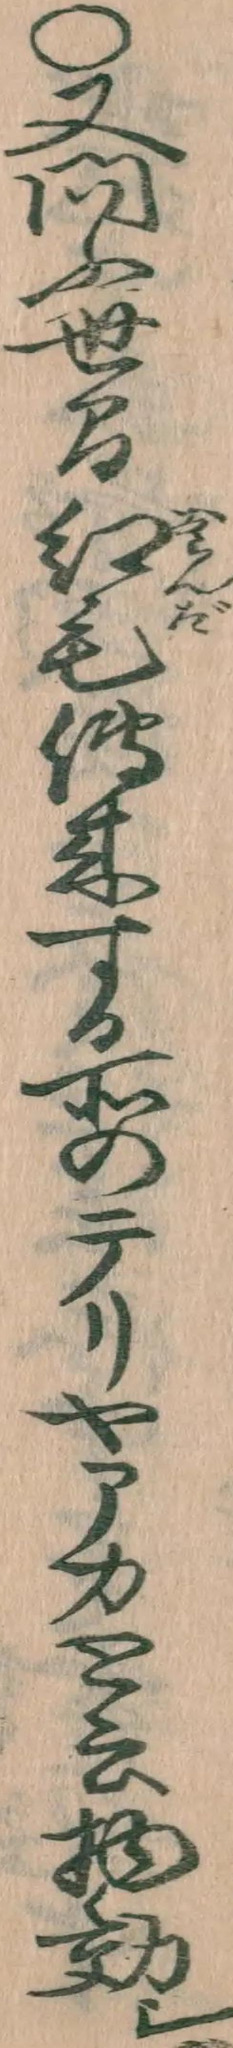○又問ふ世間紅毛伝来する所のテリヤアカと云物効シ
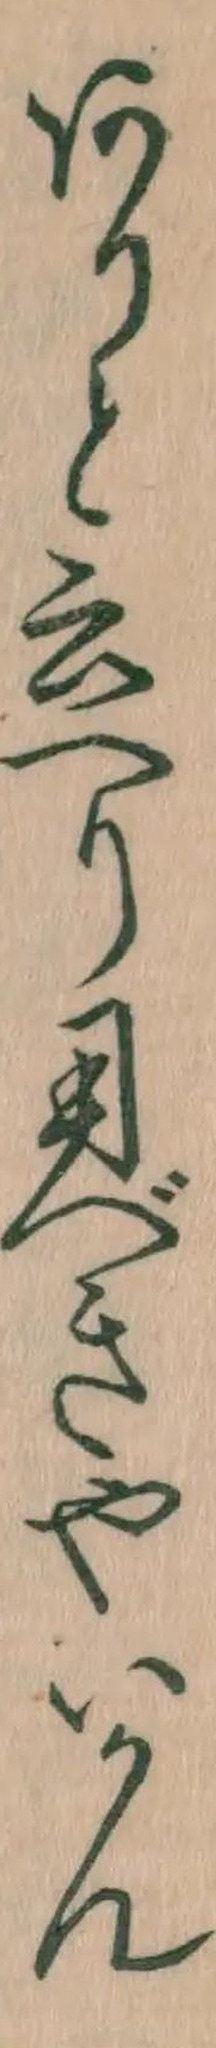ありと云へり用べきやいかん
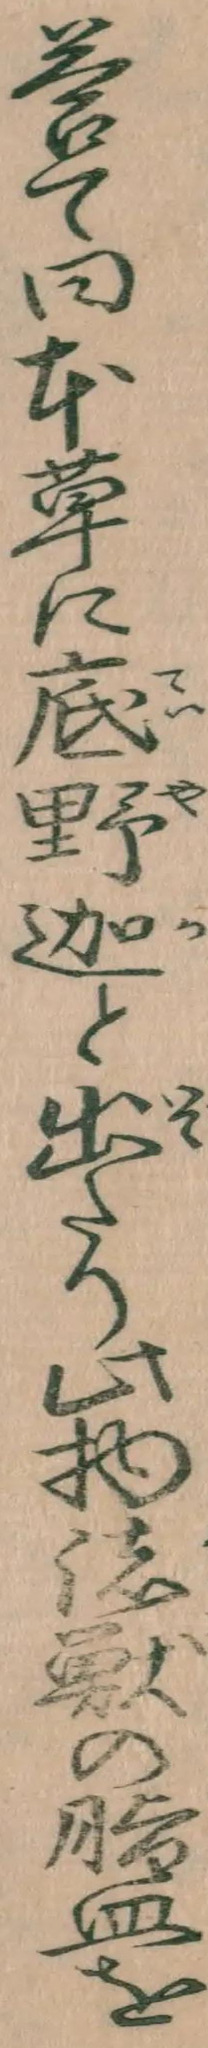答て曰本草に底野迦と出たり此物諸獣の脂血を
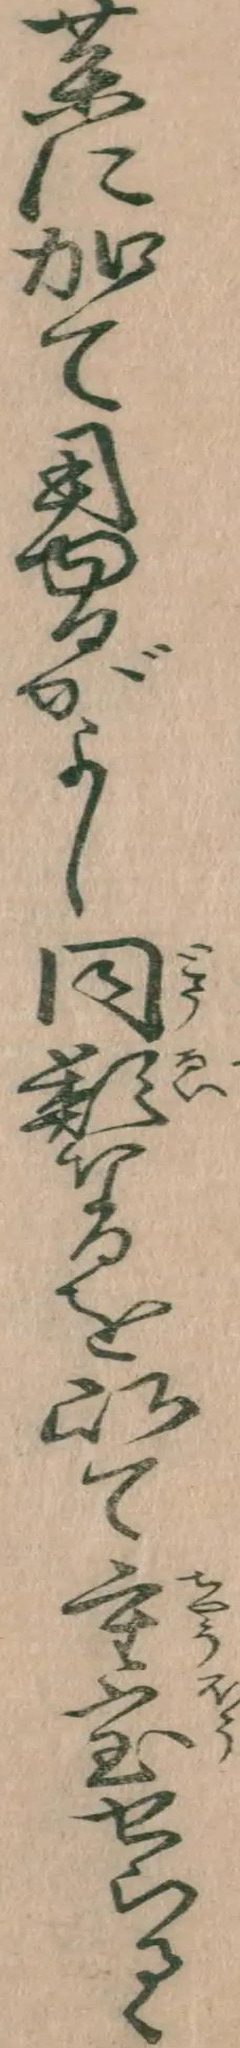薬に加て用ゆるがよし同類なるを以て重宝せらるゝ
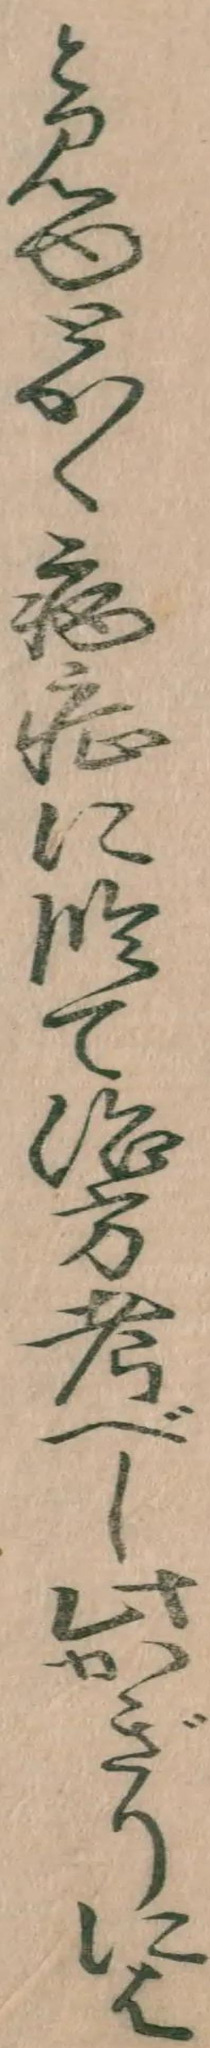と見ゆとかく病症に臨て治方考べし此かぎりには
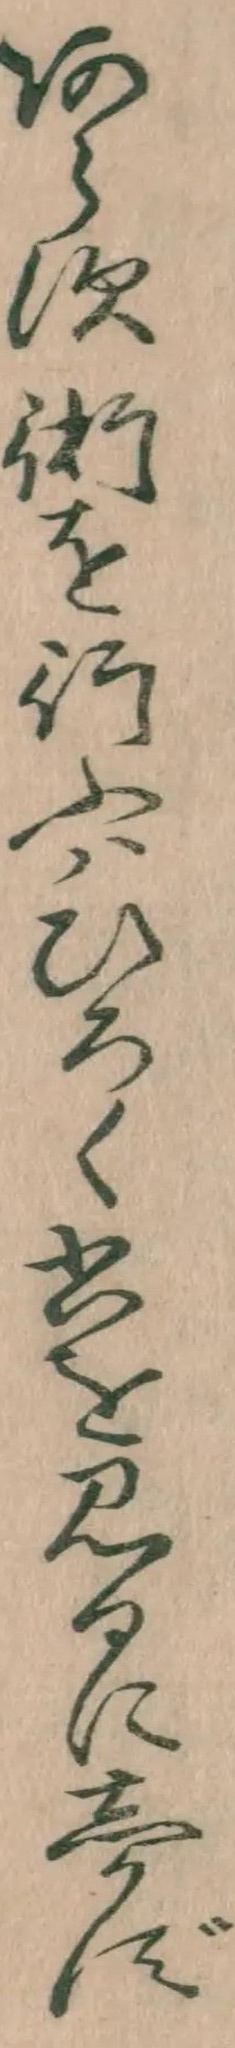あらす術を行ふはひろく書を見るにしかず

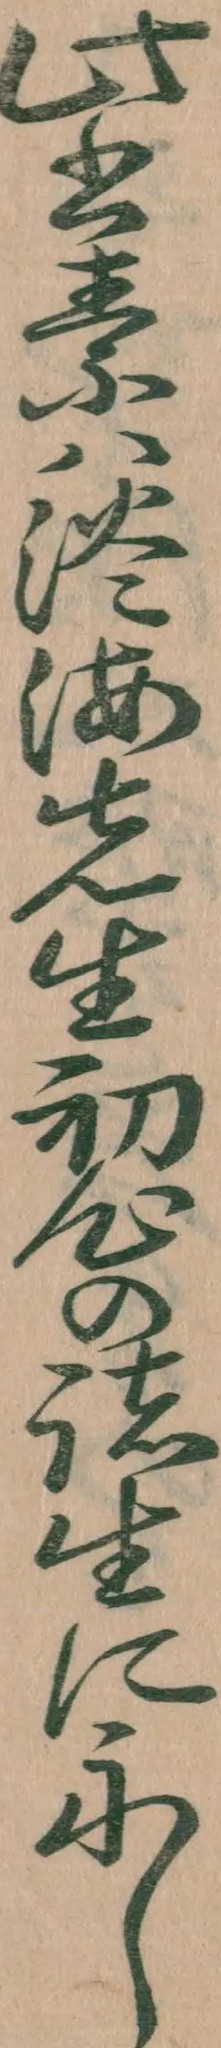此書素は淡海先生初心の諸生に示し
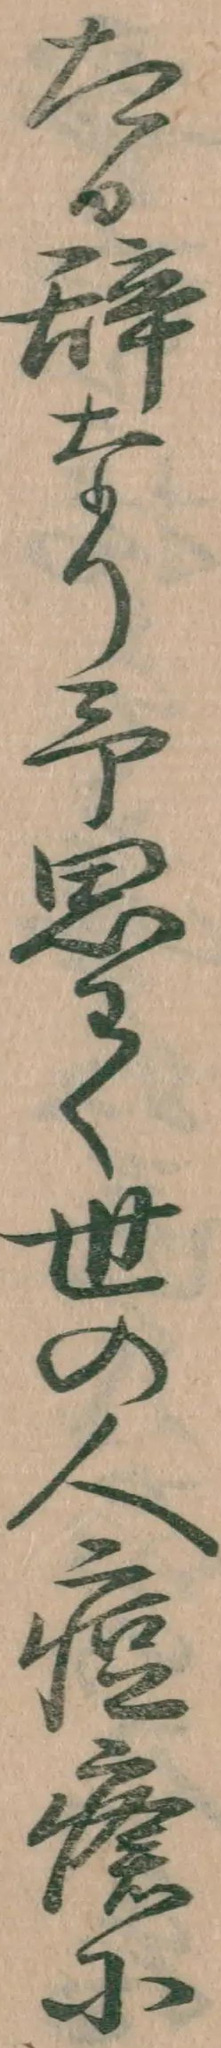たる辞なり予思わく世の人痘瘡に
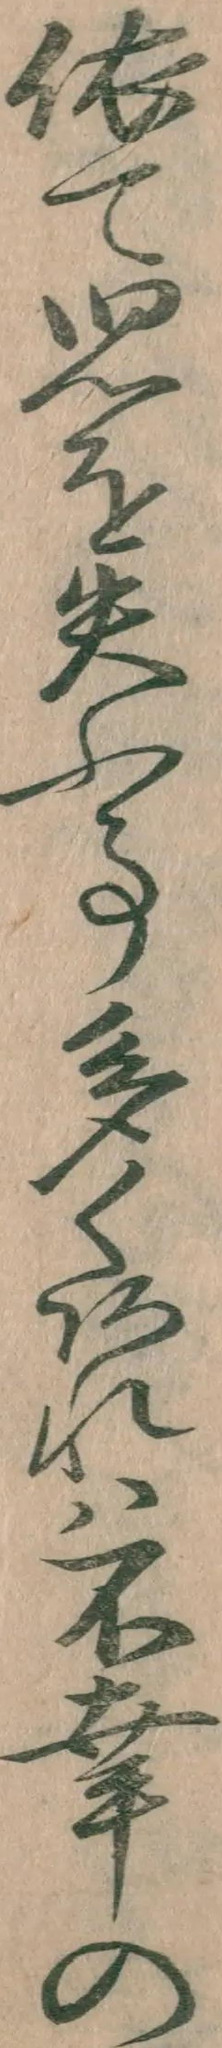依て児を失ふ事多くあれは不幸の
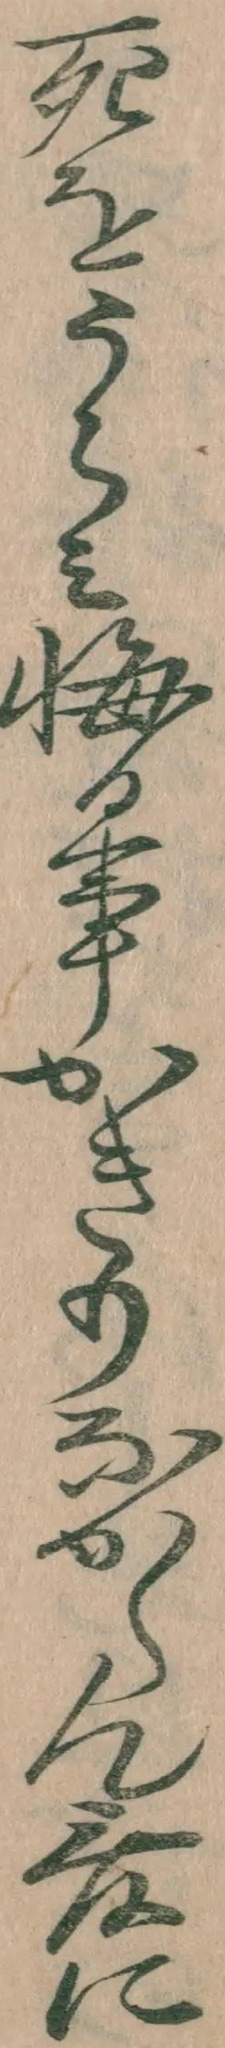死をうらみ悔る事かきりなからん爰に
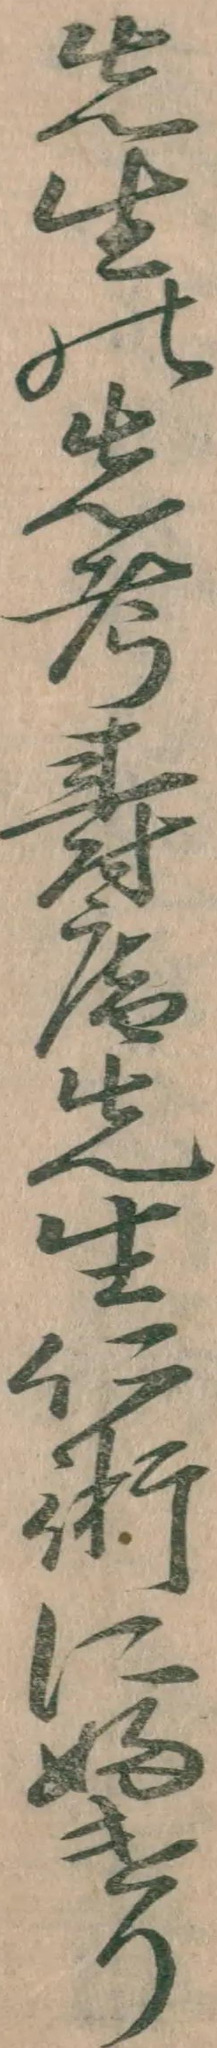先生の先考寿庵先生仁術にふけり
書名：痘家初心問答
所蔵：国立国会図書館 National Diet Library, JAPAN
